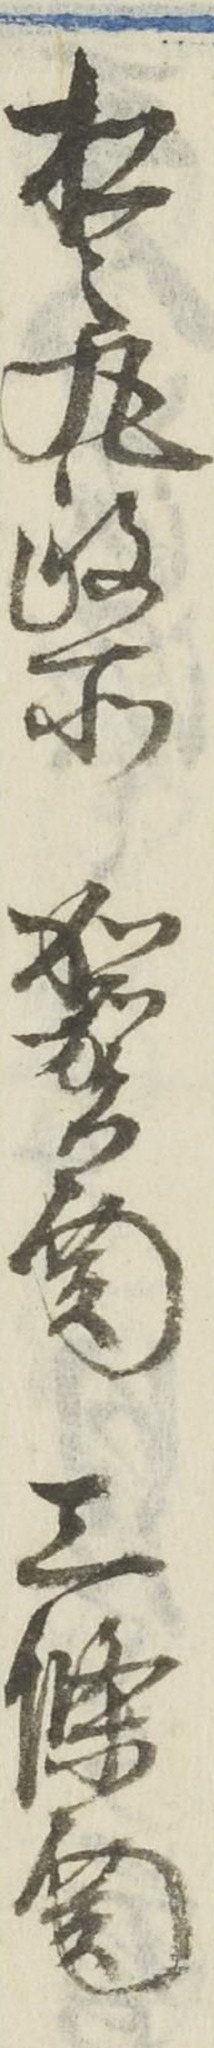松之丸政所加賀殿三條殿
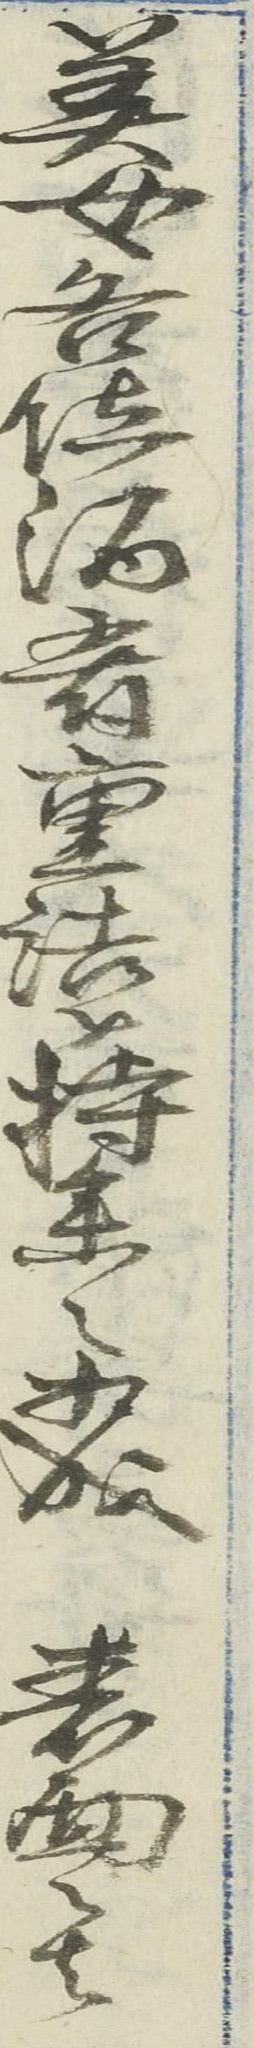美女各位酒肴重詰ヲ持参ニ相成表面ニは
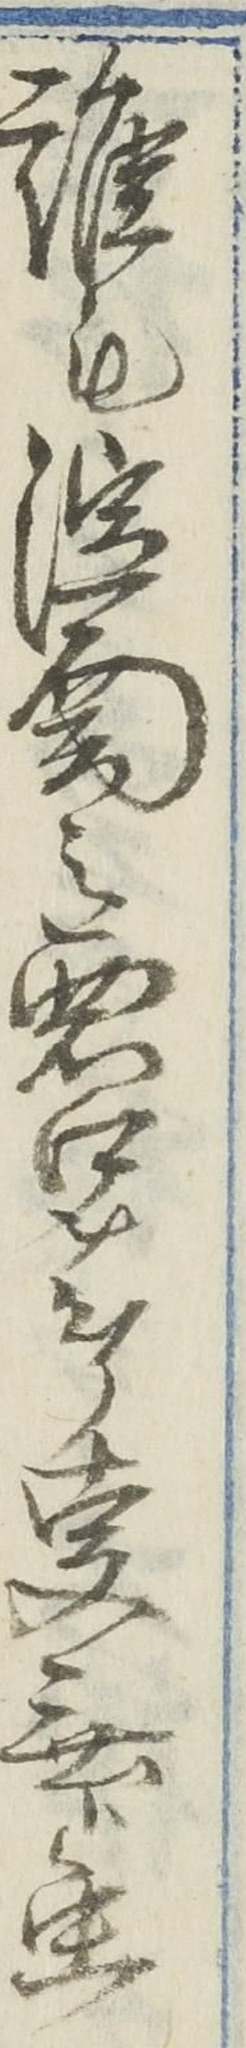誰も淀殿之悪口ヲ云ウ事無ト雖
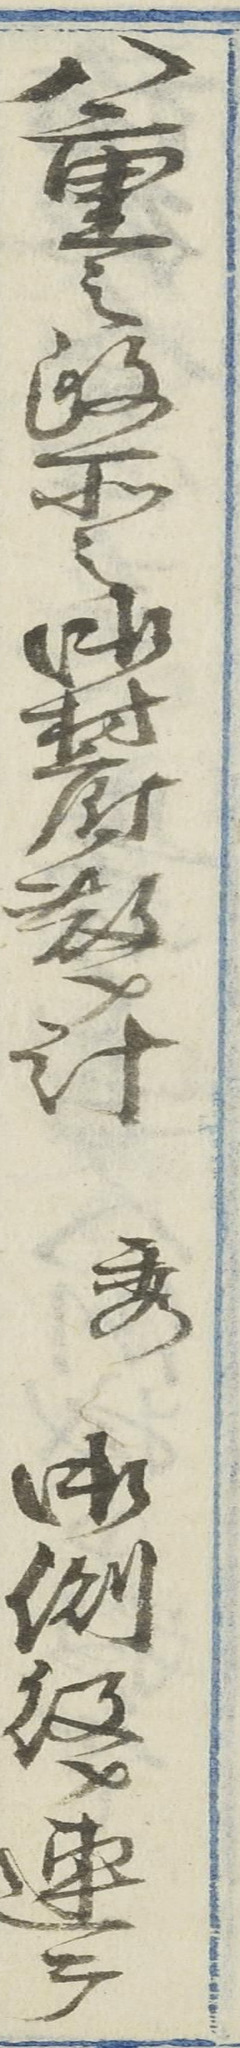八重之政所之御鬱散ヲ計秀御側役ヲ連テ
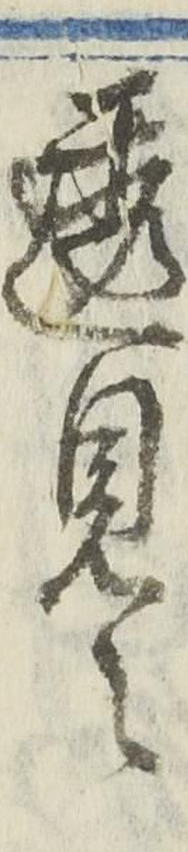透見ニ
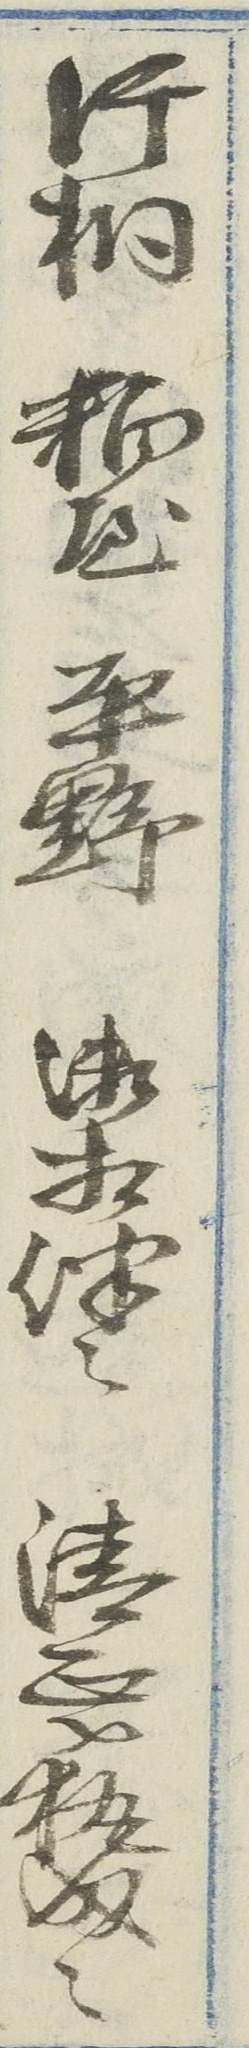片桐粕屋平野御相伴シ清正ヲ執成シ
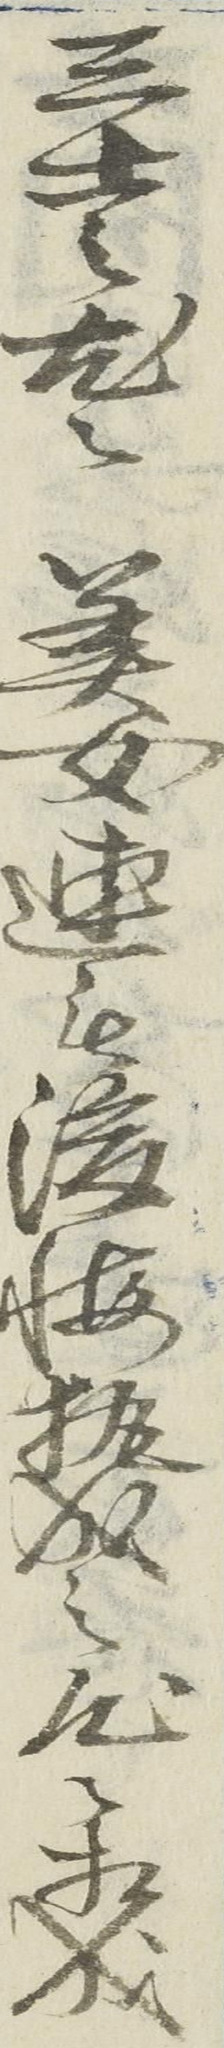三士之心ニ美女連も後悔執成之心ニ相成
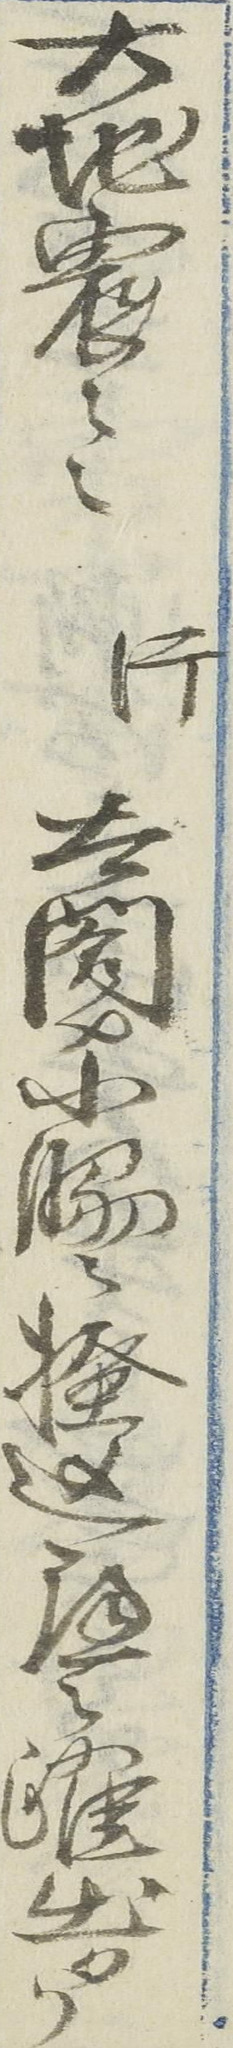大地震片太閤ヲ小脇ニ掻込庭ニ躍出タリ
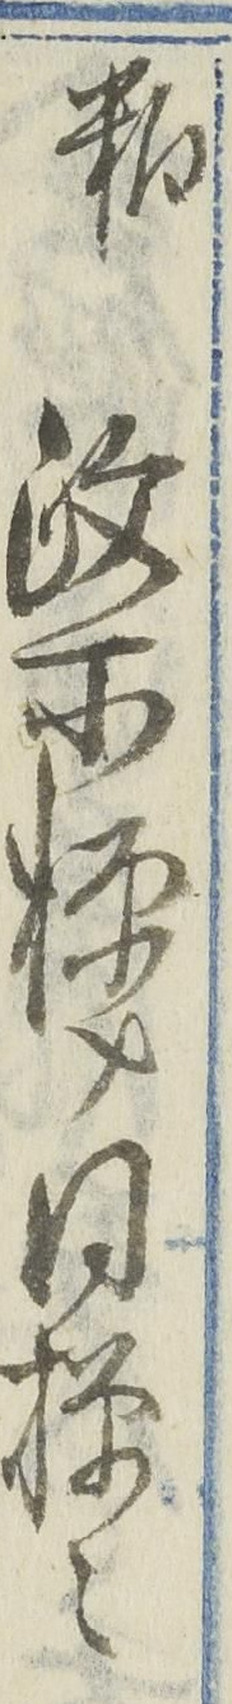粕政所様ヲ同様ニ
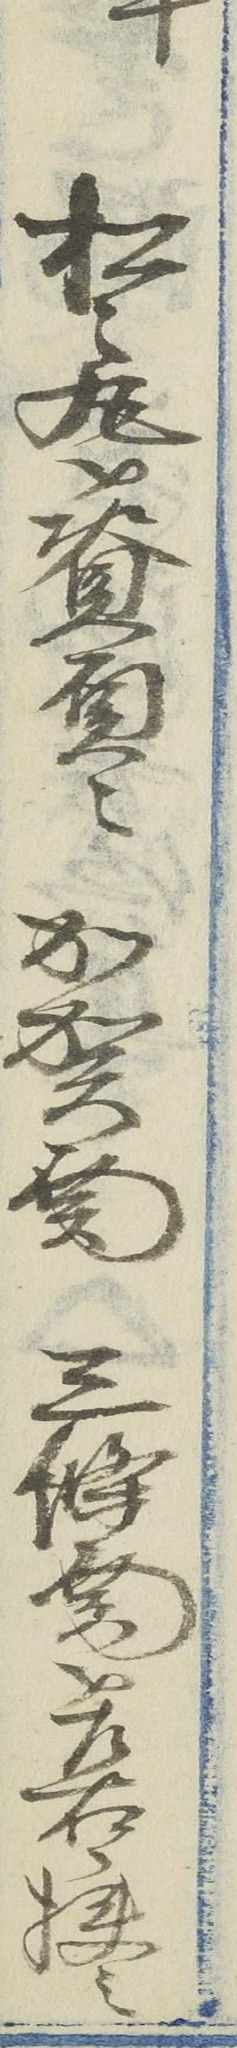平松之丸ヲ背負ニ加賀殿三條殿ヲ左右ニ挟ミ

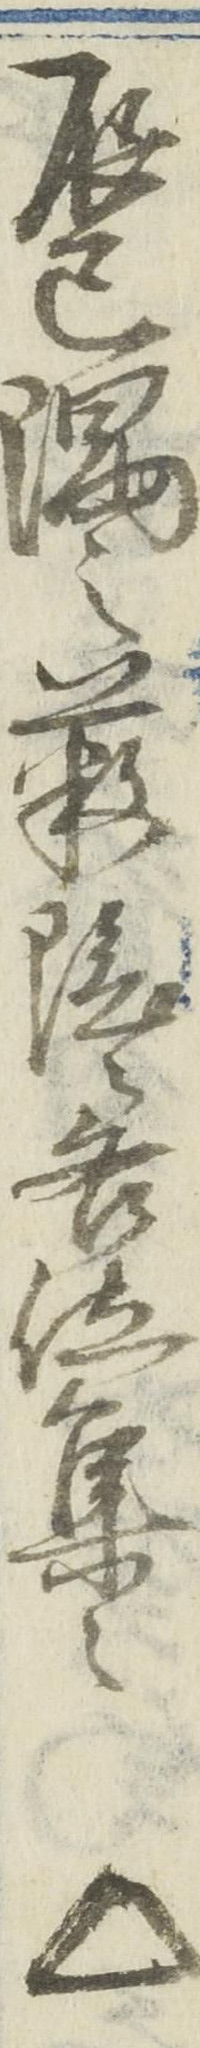辰巳隅之藪陰ニ各位集之△
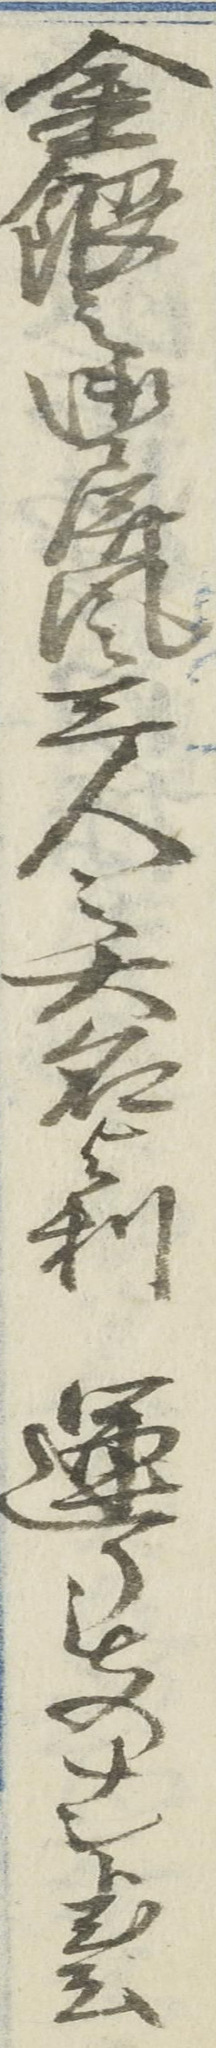金銀之御屏風三人之大名より運うものナシト云云
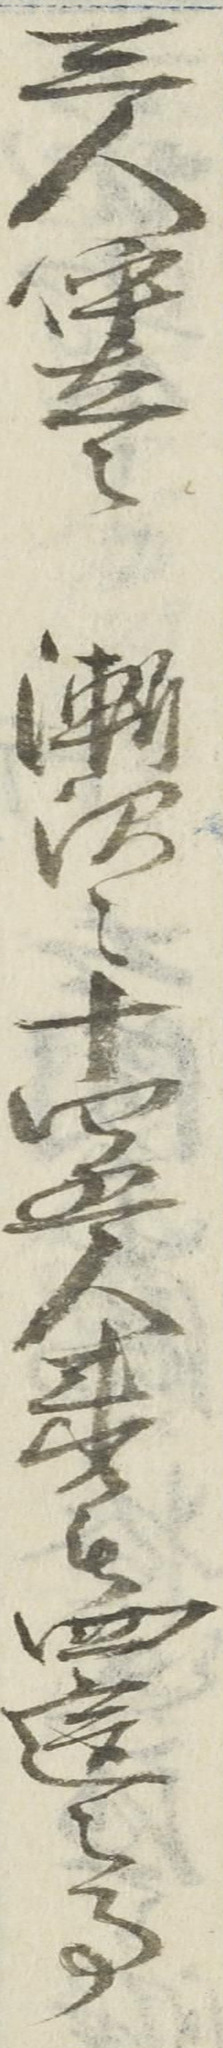三人呼立之漸次ニ十四五人来ルも四這之事
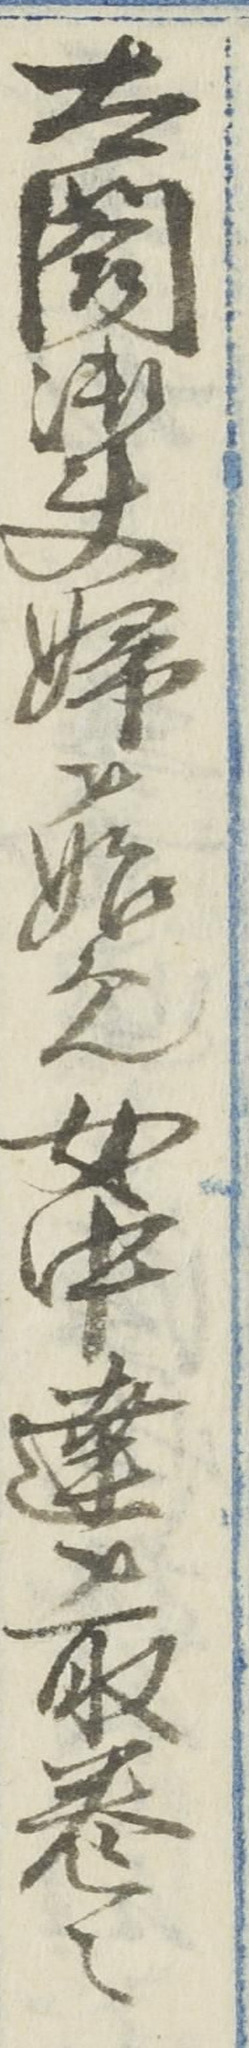太閤御夫婦ヲ始め女中達ヲ取巻ニ
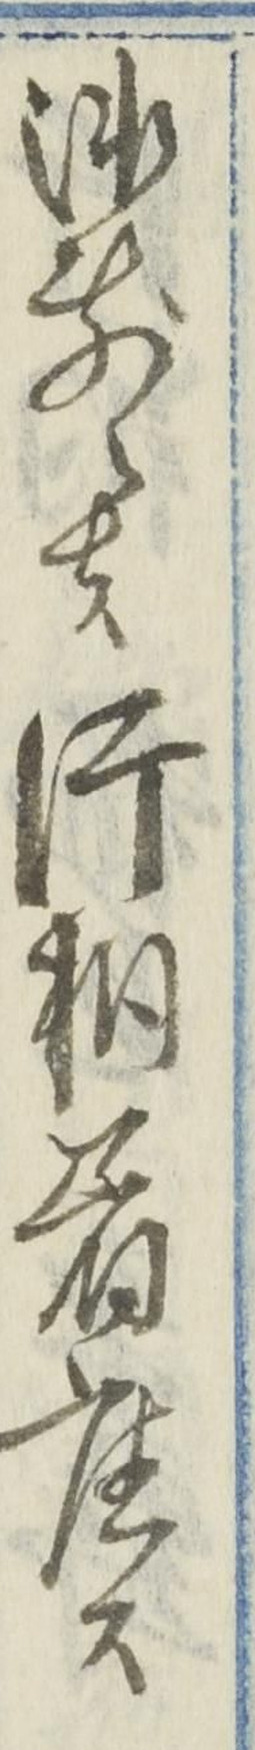御前ニ候片桐着座ス
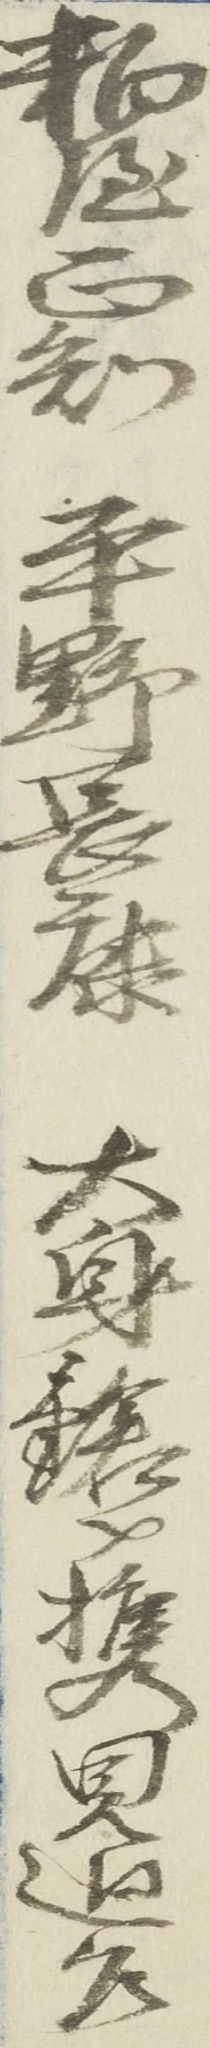粕屋正知平野長康大身鎗ヲ携見廻乍
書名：伏水大地震
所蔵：東京大学地震研究所図書室 Earthquake Research Institute Library, The University of Tokyo, JAPAN
